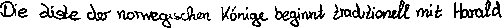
Die Liste der norwegischen Könige beginnt traditionell mit Harald
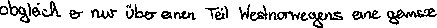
obgleich er nur über einen Teil Westnorwegens eine gewisse
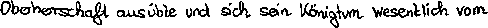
Oberherrschaft ausübte und sich sein Königtum wesentlich vom
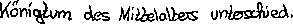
Königtum des Mittelalters unterschied.
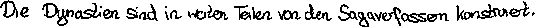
Die Dynastien sind in weiten Teilen von den Sagaverfassern konstruiert.
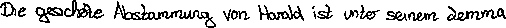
Die gesicherte Abstammung von Harald ist unter seinem Lemma
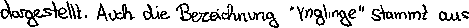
dargestellt. Auch die Bezeichnung "Ynglinge" stammt aus
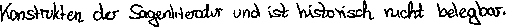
Konstrukten der Sagaliteratur und ist historisch nicht belegbar.
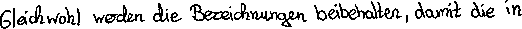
Gleichwohl werden die Bezeichnungen beibehalten, damit die in
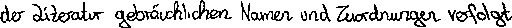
der Literatur gebräuchlichen Namen und Zuordnungen verfolgt
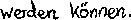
werden können.
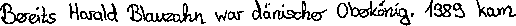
Bereits Harald Blauzahn war dänischer Oberkönig. 1389 kam
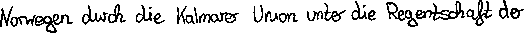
Norwegen durch die Kalmarer Union unter die Regentschaft der
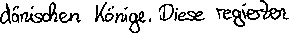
dänischen Könige. Diese regierten
